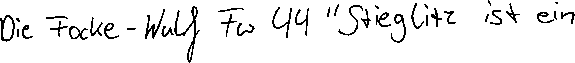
Die Focke-Wulf Fw 44 "Stieglitz" ist ein
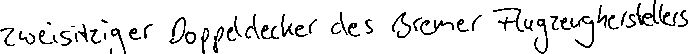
zweisitziger Doppeldecker des Bremer Flugzeugherstellers
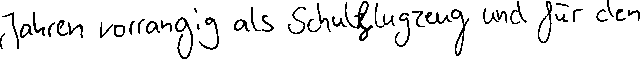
Jahren vorrangig als Schulflugzeug und für den
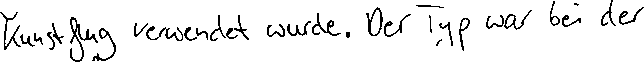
Kunstflug verwendet wurde. Der Typ war bei der
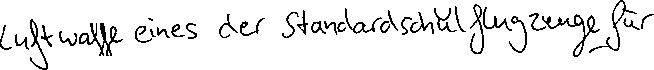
Luftwaffe eines der Standardschulflugzeuge für
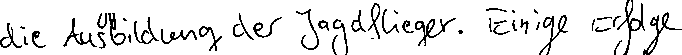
die Ausbildung der Jagdflieger. Einige Erfolge
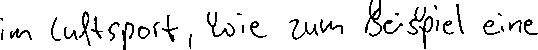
im Luftsport, wie zum Beispiel eine
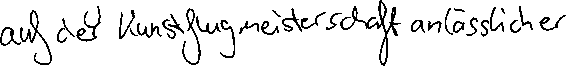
auf der Kunstflugmeisterschaft anlässlich
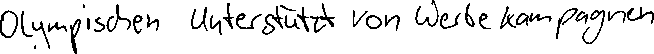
Olympischen Unterstützt von Werbekampagnen
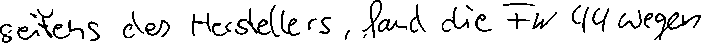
seitens des Herstellers, fand die Fw 44 wegen
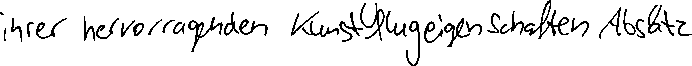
ihrer hervorragenden Kunstflugeigenschaften Absatz
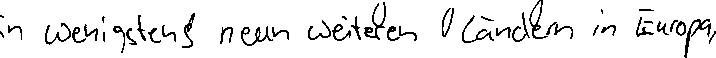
in wenigstens neun weiteren Ländern in Europa,
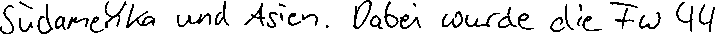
Südamerika und Asien. Dabei wurde die Fw 44
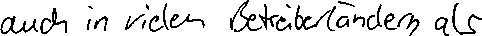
auch in vielen Betreiberländern als
